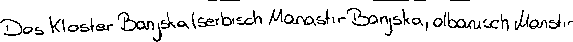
Das Kloster Banjska (serbisch Manastir Banjska; albanisch Manstiri
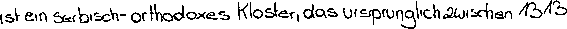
ist ein serbisch-orthodoxes Kloster, das ursprünglich zwischen 1313
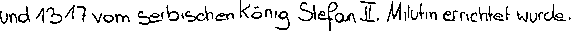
und 1317 vom serbischen König Stefan II. Milutin errichtet wurde.
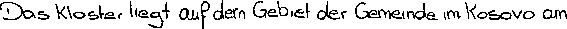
Das Kloster liegt auf dem Gebiet der Gemeinde im Kosovo am
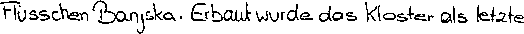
Flüsschen Banjska. Erbaut wurde das Kloster als letzte
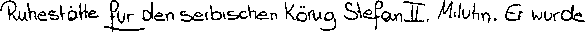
Ruhestätte für den serbischen König Stefan II. Milutin. Er wurde
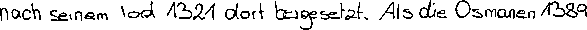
nach seinem Tod 1321 dort beigesetzt. Als die Osmanen 1389
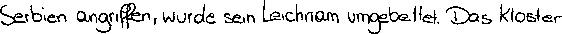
Serbien angriffen, wurde sein Leichnam umgebettet. Das Kloster
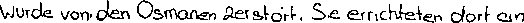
wurde von den Osmanen zerstört. Sie errichteten dort ein
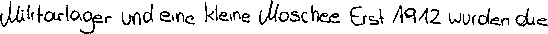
Militärlager und eine kleine Moschee. Erst 1912 wurden die
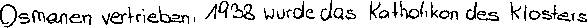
Osmanen vertrieben. 1938 wurde das Katholikon des Klosters
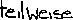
teilweise
